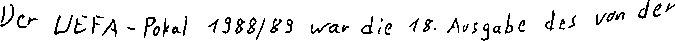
Der UEFA-Pokal 1988/89 war die 18. Ausgabe des von der
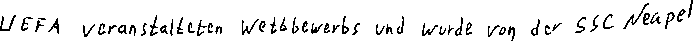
UEFA veranstalteten Wettbewerbs und wurde von der SSC Neapel
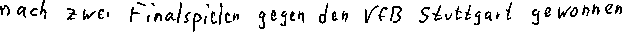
nach zwei Finalspielen gegen den VfB Stuttgart gewonnen.
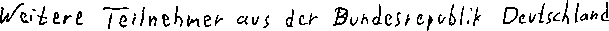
Weitere Teilnehmer aus der Bundesrepublik Deutschland
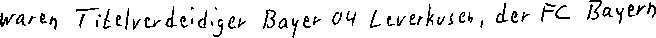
waren Titelverteidiger Bayer 04 Leverkusen, der FC Bayern
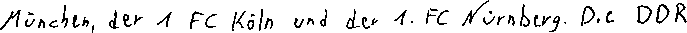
München, der 1. FC Köln und der 1. FC Nürnberg. Die DDR
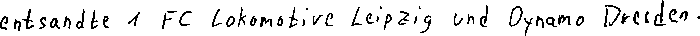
entsandte 1. FC Lokomotive Leipzig und Dynamo Dresden.
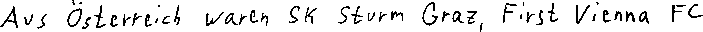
Aus Österreich waren SK Sturm Graz, First Vienna FC
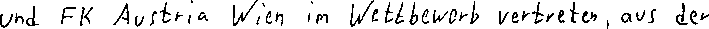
und FK Austria Wien im Wettbewerb vertreten, aus der
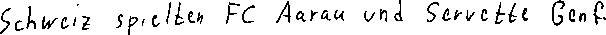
Schweiz spielten FC Aarau und Servette Genf.
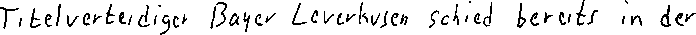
Titelverteidiger Bayer Leverkusen schied bereits in der
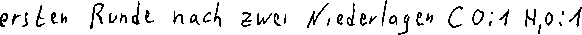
ersten Runde nach zwei Niederlagen (0:1 H, 0:1
